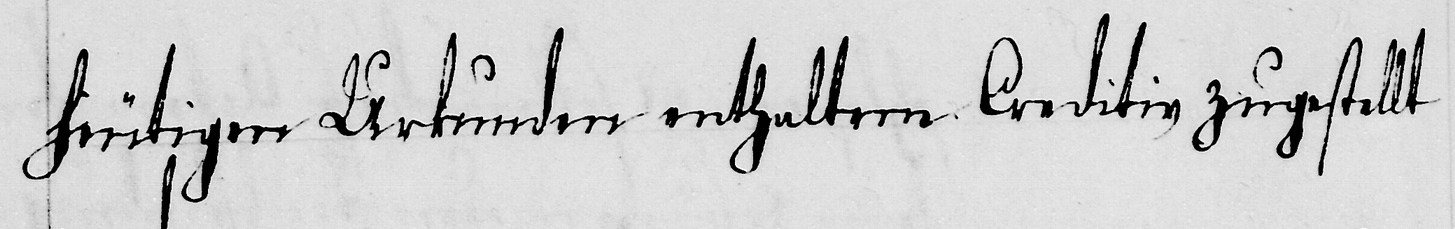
heutigen Urkunden enthaltene Creditiv zugestel¬
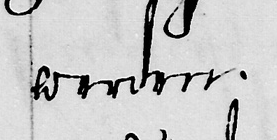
werden.
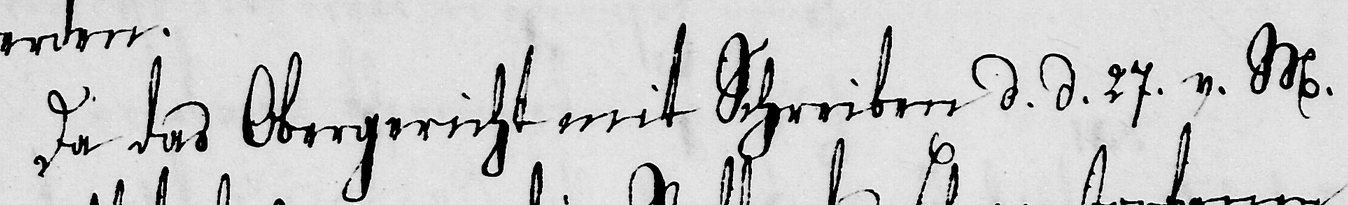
Da das Obergericht mit Schreiben d. d. 27. v. M.
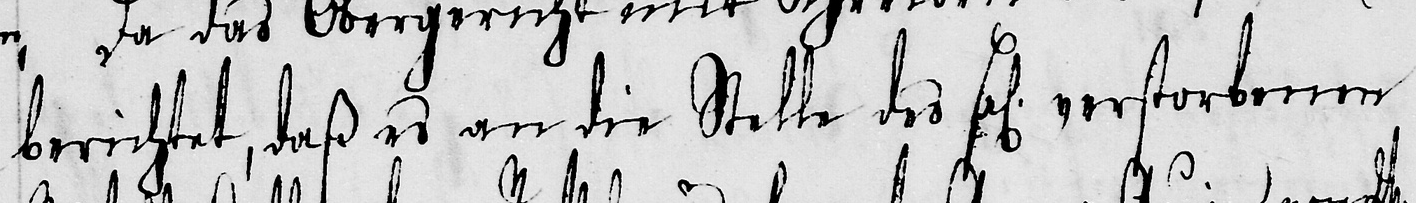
berichtet, daß es an die Stelle des sel. verstorbenen
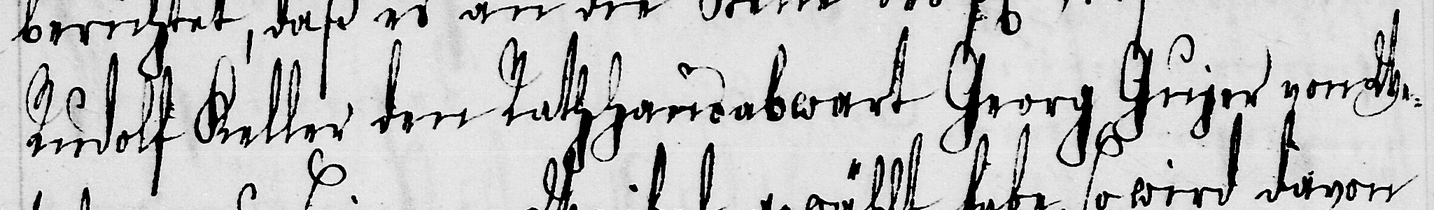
Rudolf Keller den Rathhausabwart Georg Gujer von We¬
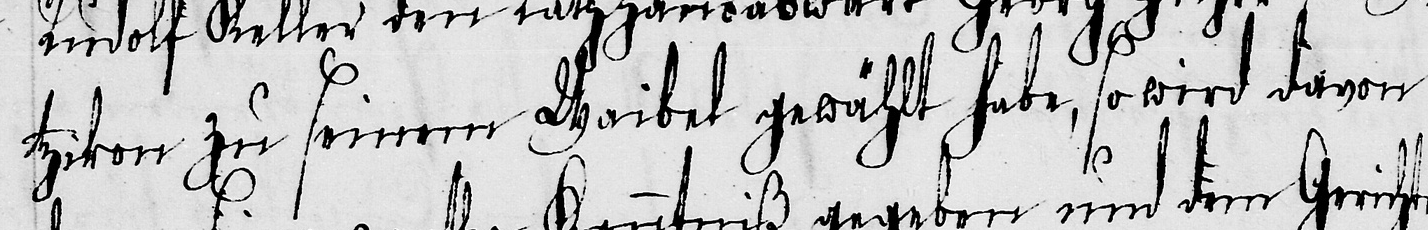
tzikon zu seinem Waibel gewählt habe, so wird davon
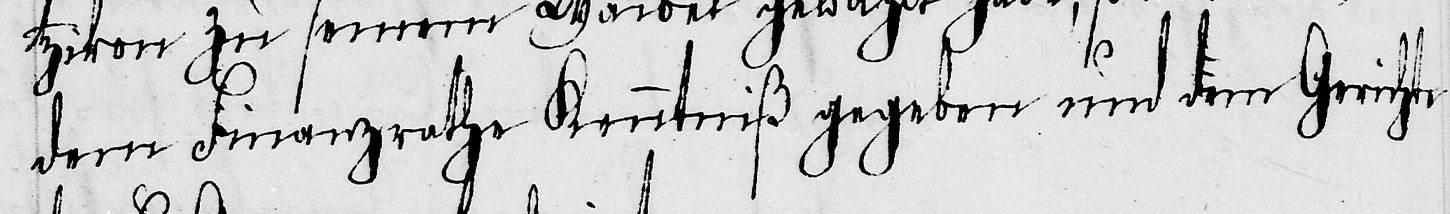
dem Finanzrathe Kenntniß gegeben und dem Gerichte
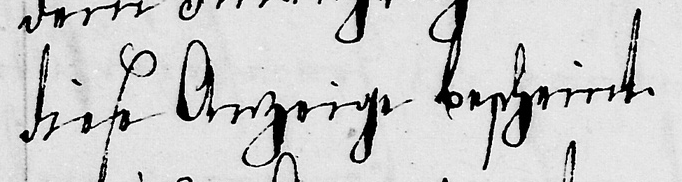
diese Anzeige bescheint.
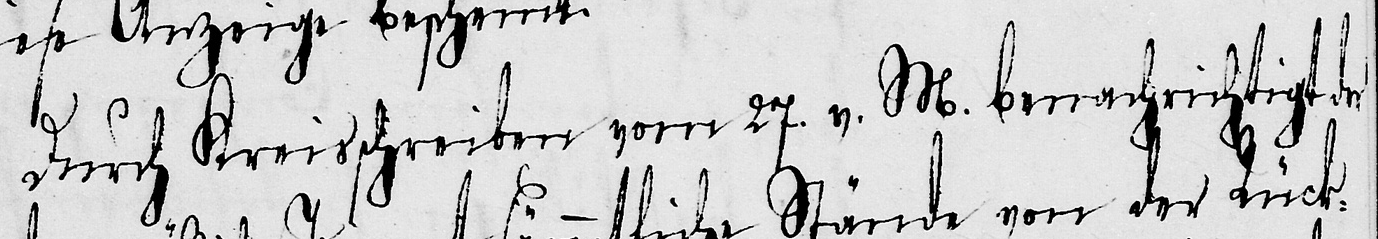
Durch Kreisschreiben vom 27. v. M. benachrichtigt
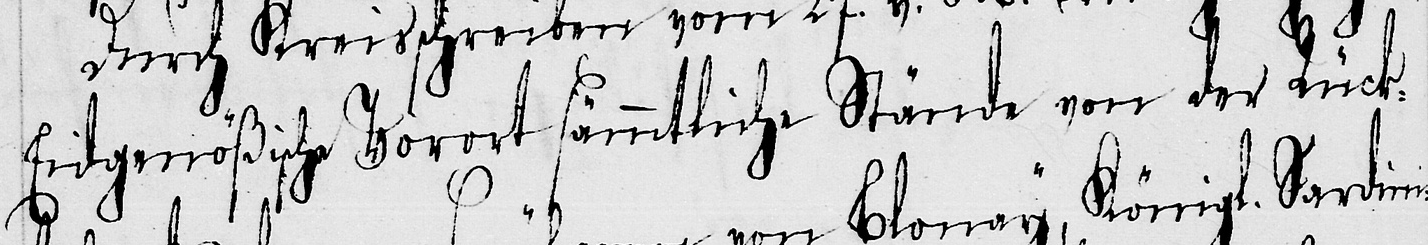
Eidgenößisches Vorort sämmtliche Stände von der Rück¬
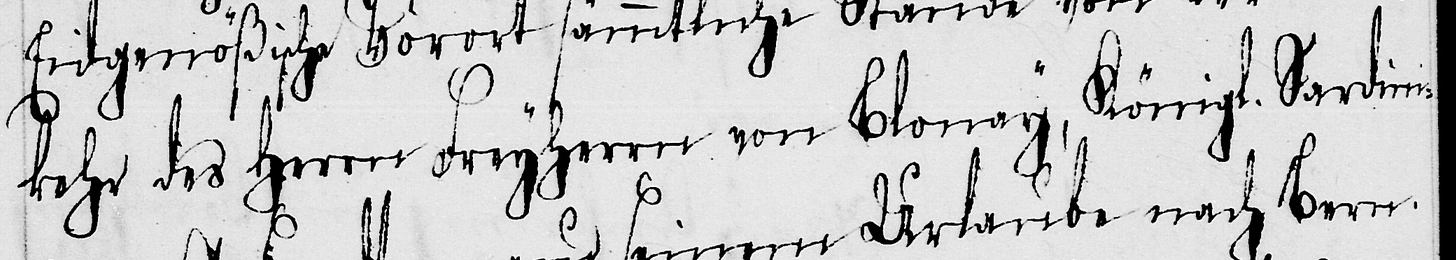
kehr des Herrn Freyherrn von Blonay, Königl. Sardin¬
